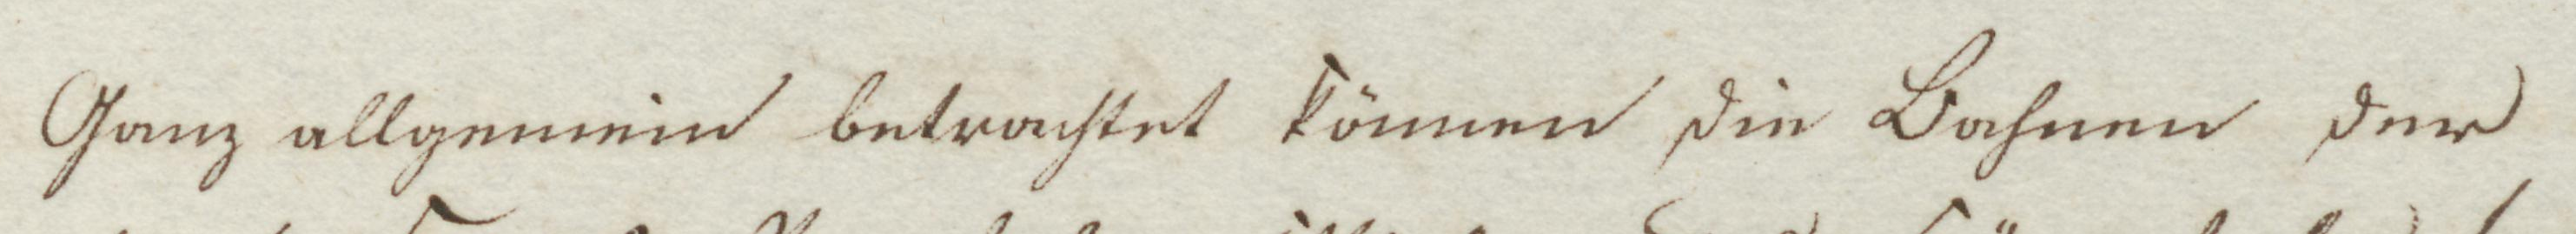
Ganz allgemein betrachtet können die Bahnen der
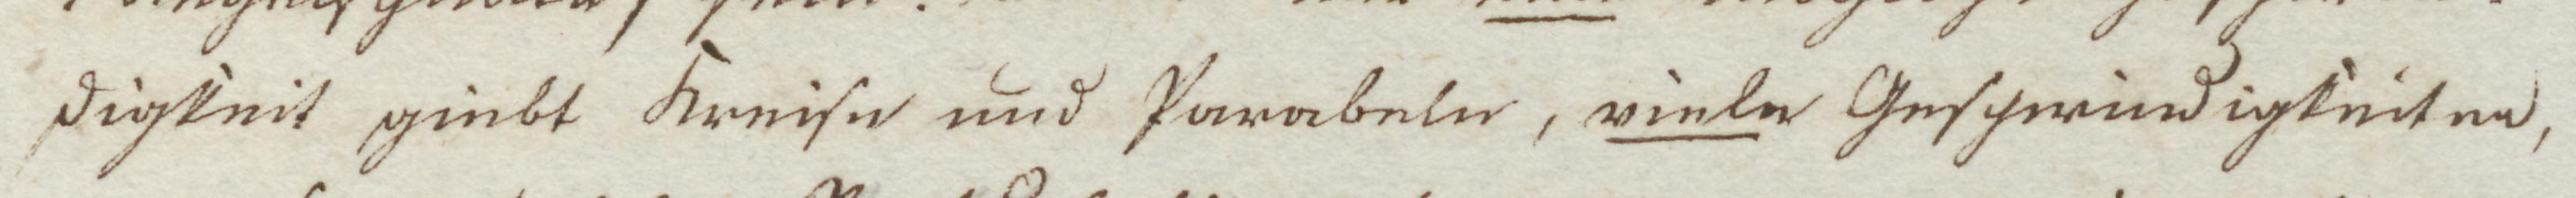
digkeit giebt Kreise und Parabeln, viele Geschwindigkeiten,
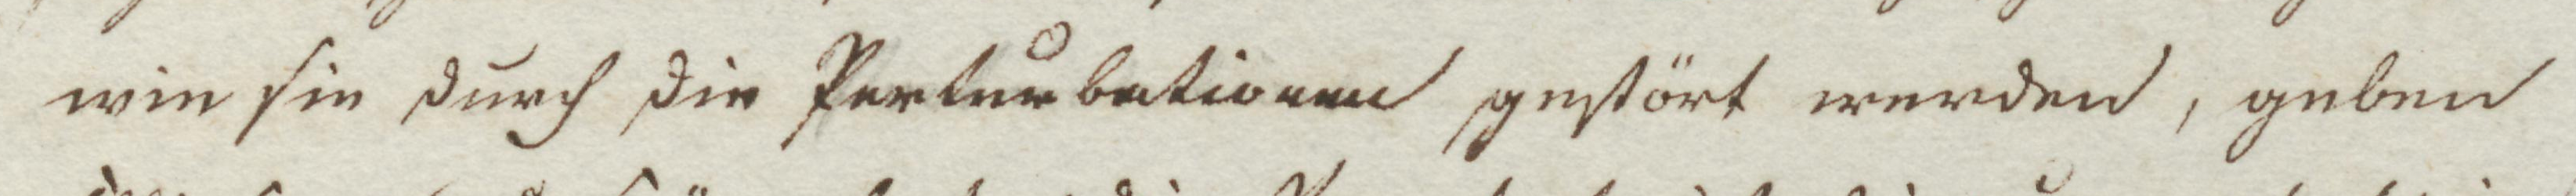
wie sie durch die Perturbationen gestört werden, geben
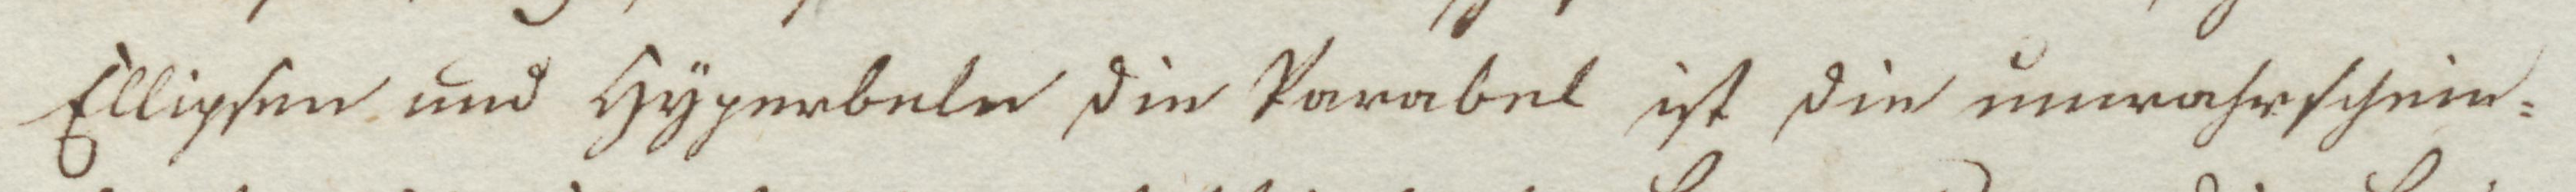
Ellipsen und Hÿperbeln; die Parabel ist die unwahrschein-
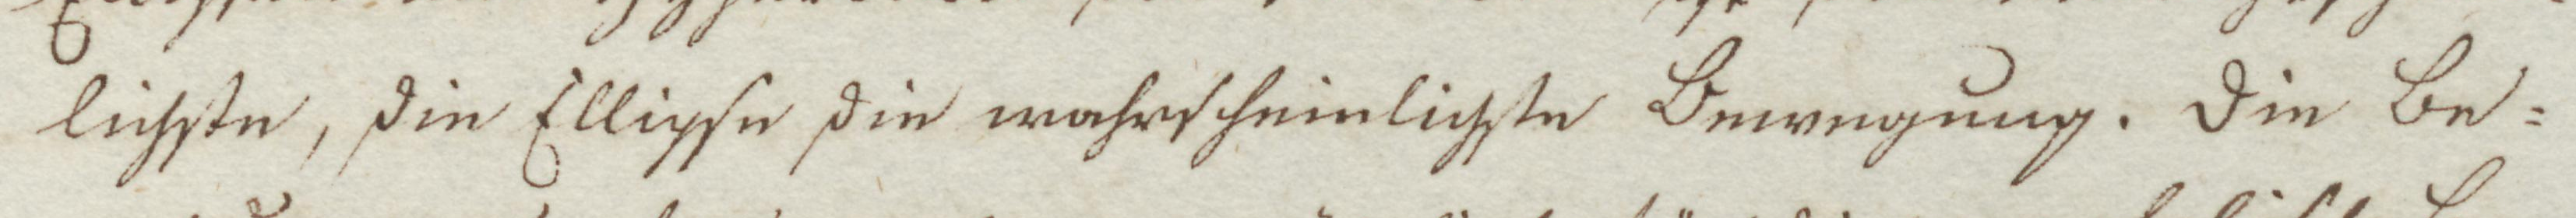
lichste, die Ellipse die wahrscheinlichste Bewegung. Die Be-
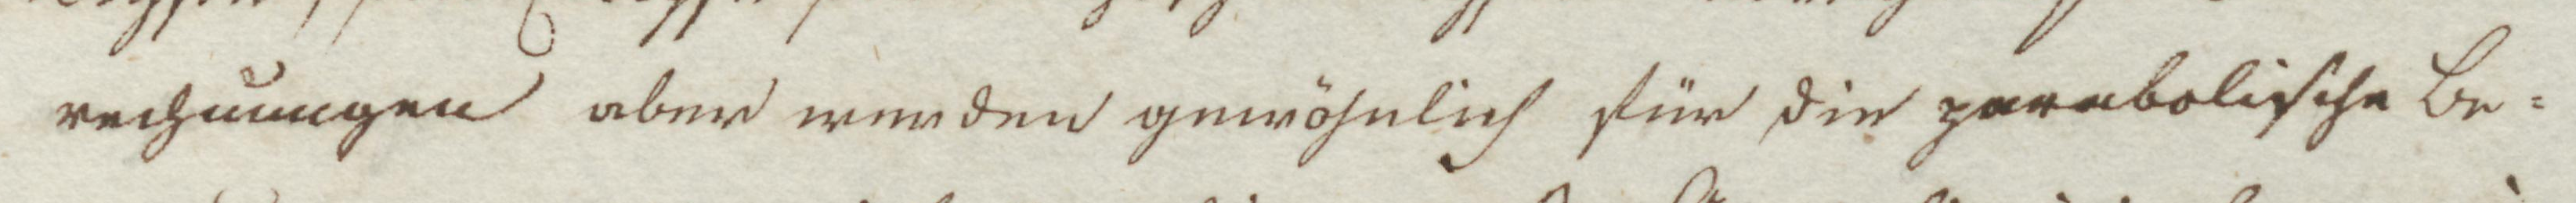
rechnungen aber werden gewöhnlich für die parabolische Be-
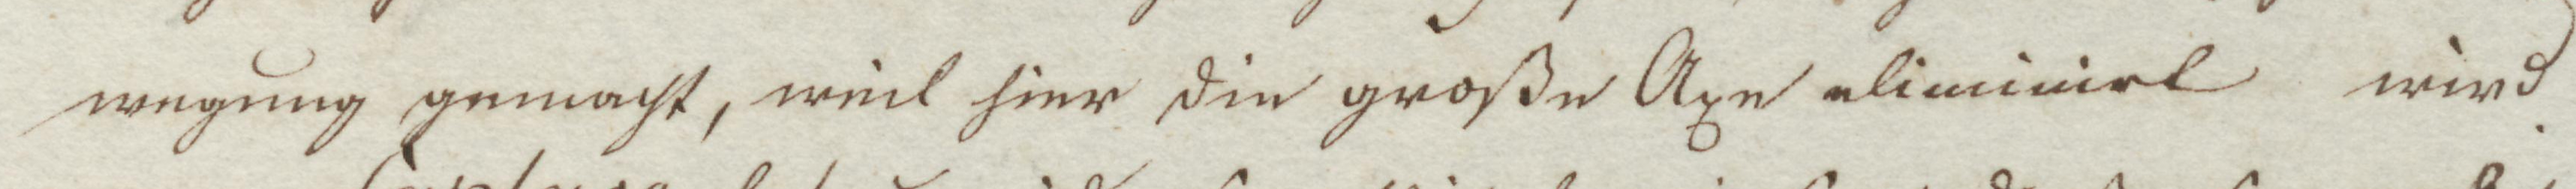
wegung gemacht, weil hier die große Axe eliminirt wird.
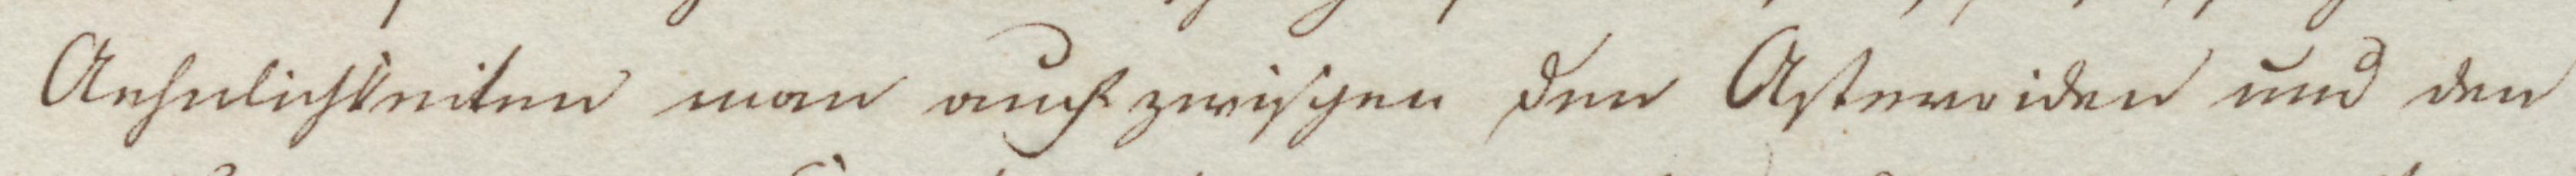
Aehnlichkeiten man auch zwischen den Asteroiden und den
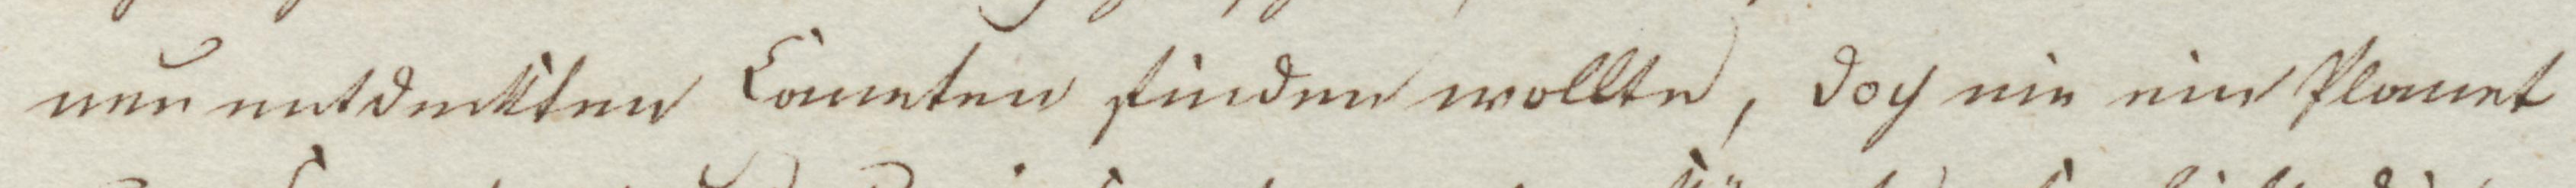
neu entdeckten Cometen finden wollte, doch nie ein Planet
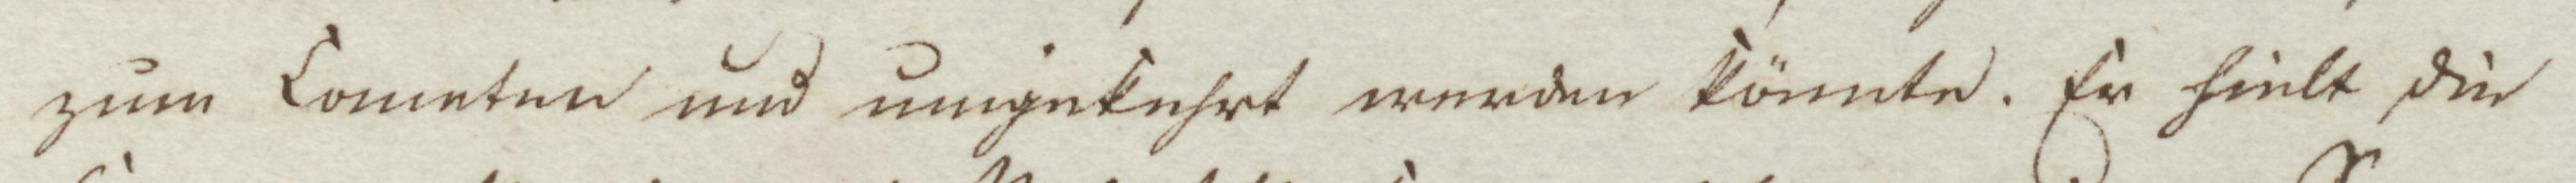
zum Cometen und umgekehrt werden könnte. Er hielt die
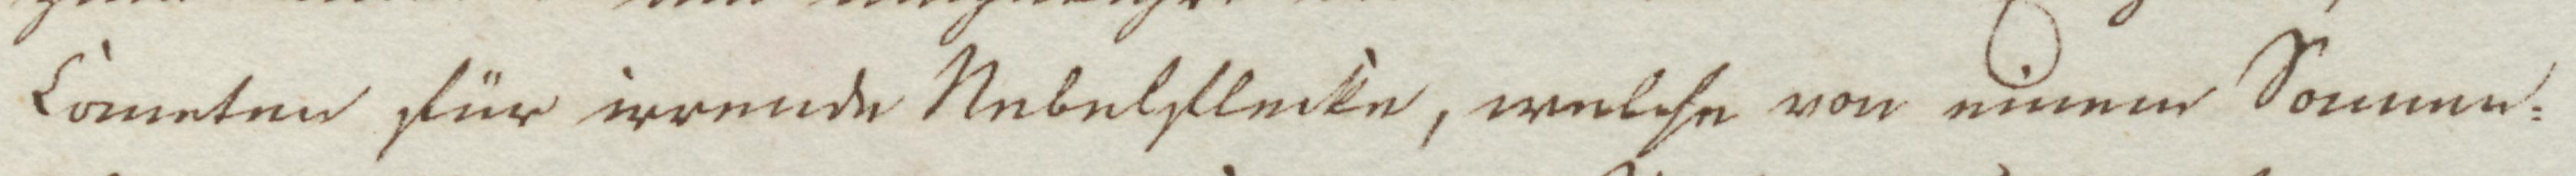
Cometen für irrende Nebelflecke, welche von einem Sonnen-
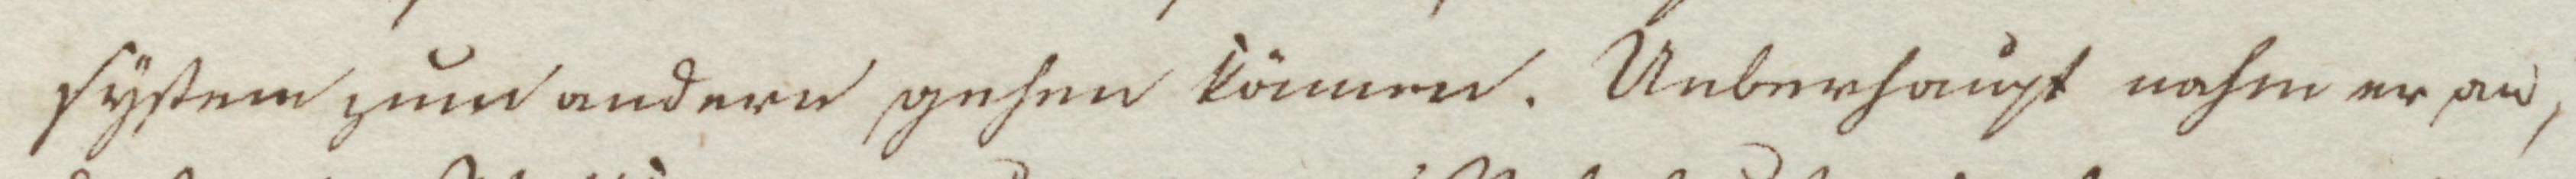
sÿstem zum andern gehen können. Ueberhaupt nahm er an,
